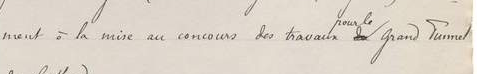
ment à la mise au concours des travaux dupour le Grand Tunnel
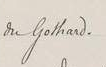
du Gothard.
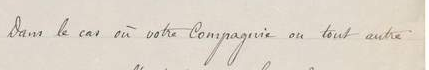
Dans le cas où votre Compagnie ou tout autre
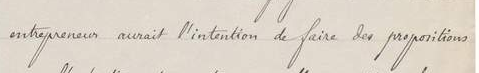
entrepreneur aurait l'intention de faire des propositions
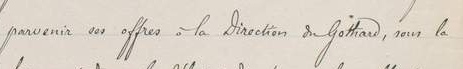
parvenir ses offres à la Direction du Gothard, sous la
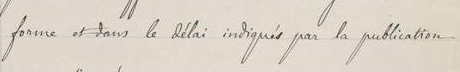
forme et dans le délai indiqués par la publication
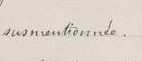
susmentionnée.
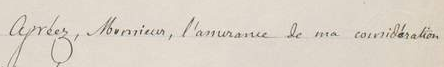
Agréez, Monsieur, l'assurance de ma considération
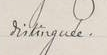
distinguée.
